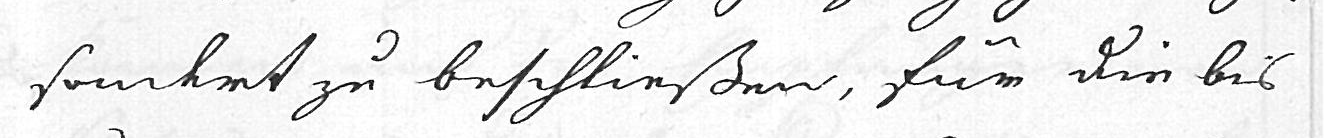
sondert zu beschließen, für die bis
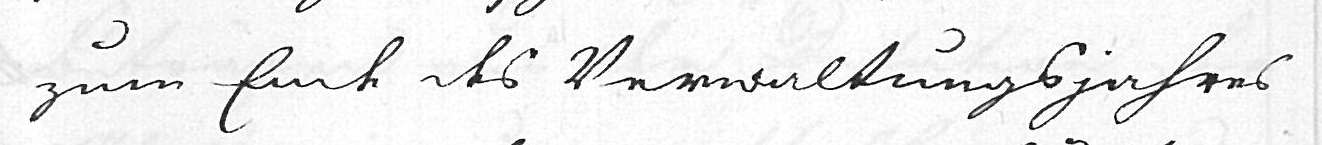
zum Ende des Verwaltungsjahres
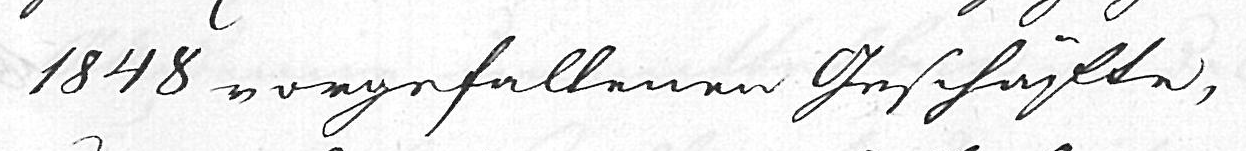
1848 vorgefallenen Geschäfte,
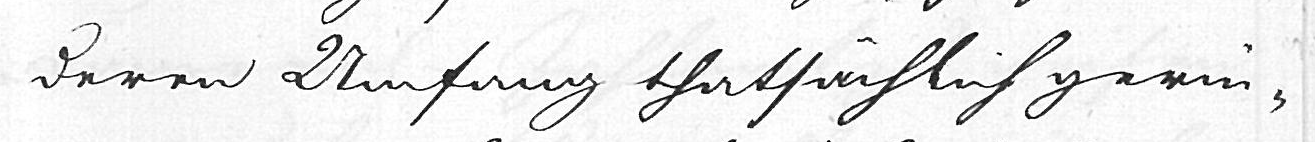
deren Anfang thatsächlich gerin-
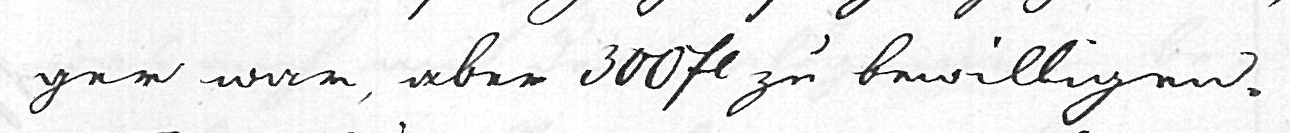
ger war, aber 300 fl zu bewilligen.
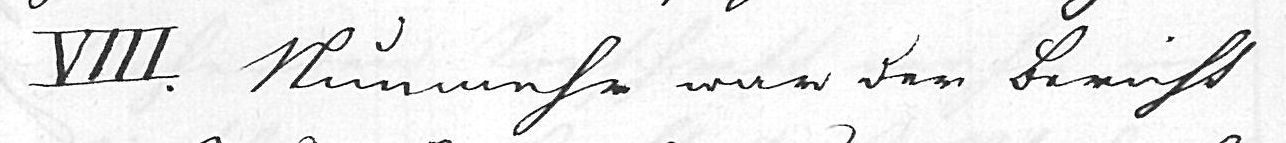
VIII. Nunmehr war der Bericht
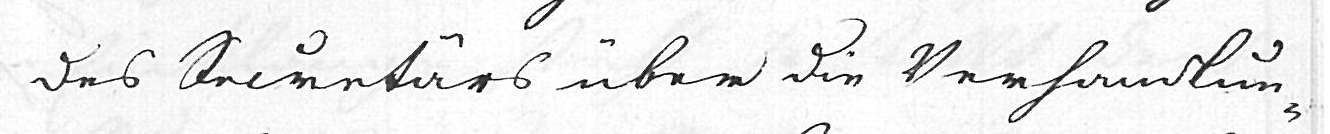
des Secretärs über die Verhandlun-
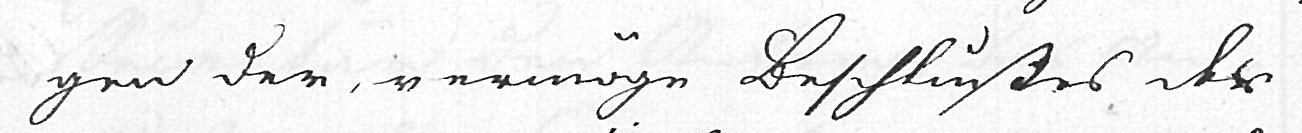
gen der, vermöge Beschlußes der
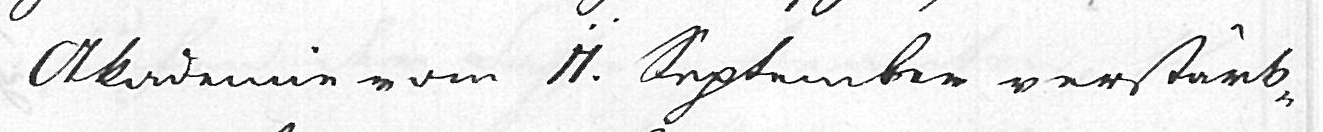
Akademie vom 11. Septenber verstärk-
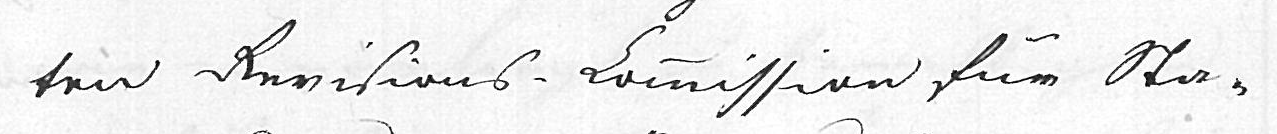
ten Revisions-Commission für Sta-
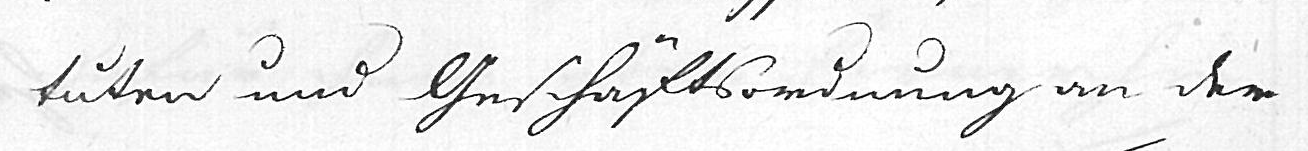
tuten und Geschäftsordnung an der
